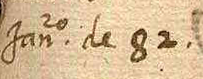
Janro. de 82.
